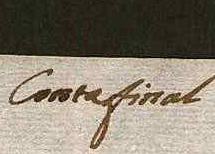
Conta final
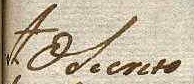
AO Secreto
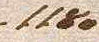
1180
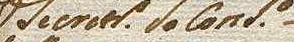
O Secretr.o do Cons.o
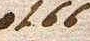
0166
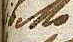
bello
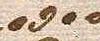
0900
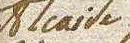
Alcaide
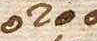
0200
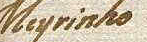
Meyrinho
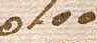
0100
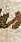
as
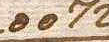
0072
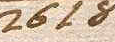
2618
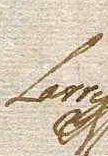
Larre
